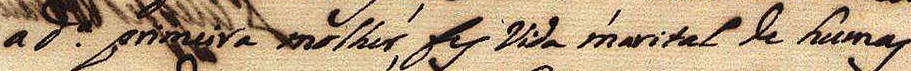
a d.a primeira molher, fes Vida marital de humas
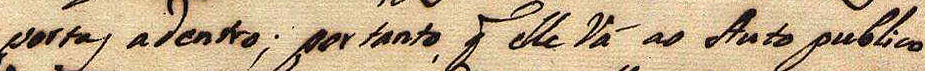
portas adentro; portanto, q̄ elle Vá ao Auto publico
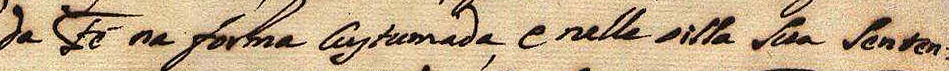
da Fé na forma Custumada, e nelle oissa sua senten
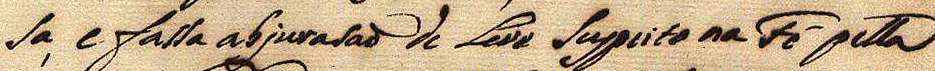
sa, e fassa abjurasaõ de Leve suspeito na Fé pella
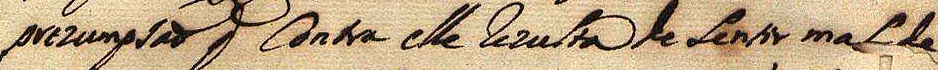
prezumpsaõ q̄ Contra elle Rezulta de sentir mal de
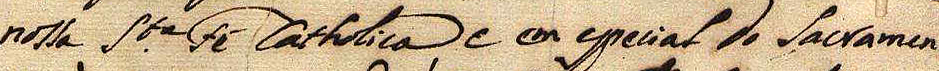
nossa S.ta Fé Catholica, e em especial do Sacramen
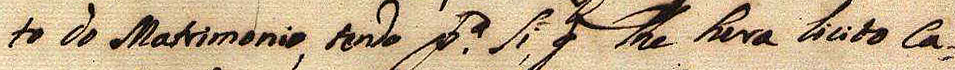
to do Matrimonio, tendo p.a si, q̄ lhe hera licito ca
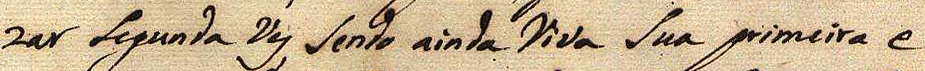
zar segunda Ves sendo ainda Viva sua primeira e
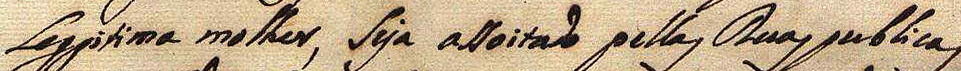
Leggitima molher, seja assoitado pellas Ruas publicas
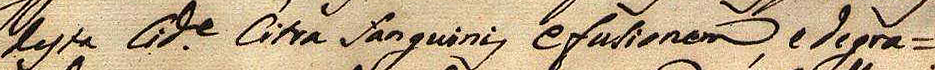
desta Cid.e Citra sanguinis efusionem, e degra
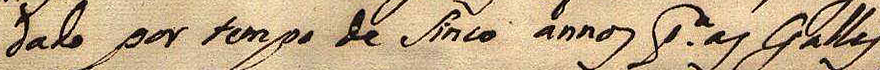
dado por tempo de sinco annos p.a as Galles
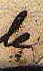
de
